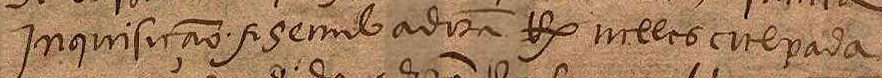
Jnquisição. e semdo a dita Rꝭ nelles culpada
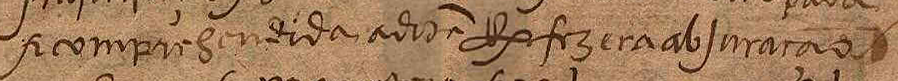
e comprehendida a dita Rꝭ fezera abJuraçaõ
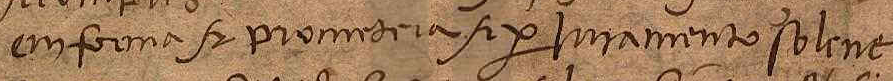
em forma e prometera e ꝑ Juramento solene
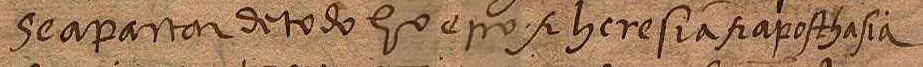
se apartar de todo ho erro e heresia e aposthasia
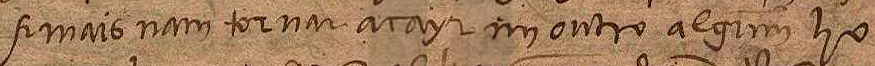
e mais nam tornar a cayr em outro algum ho
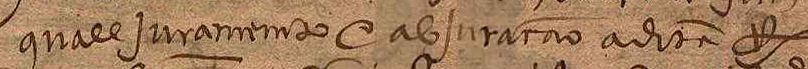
quall Juramemto e abJuração a dita Rꝭ
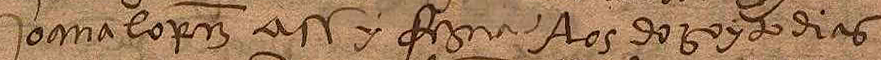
Joana lopez assy fezera Aos dezoyto dias
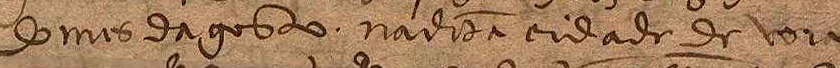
do mes dagosto na dita cidade devora
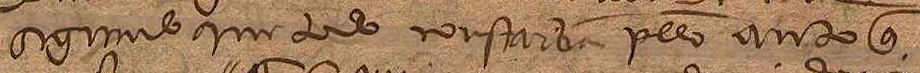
segundo que todo constaua p̄llo auto q̄
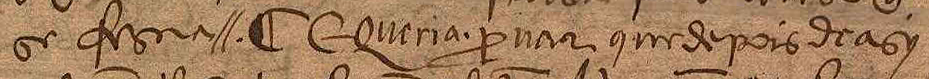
se fezera /. ¶ E Queria. ꝓuar que depois de asy
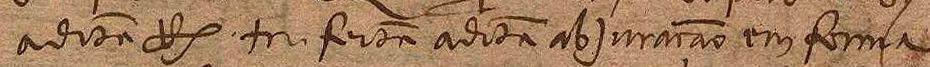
a dita Rꝭ. ter feita a dita abJuração em forma
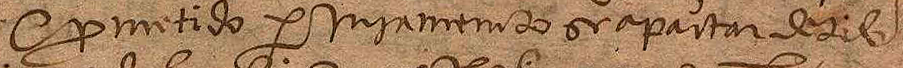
e ꝓmetido ꝑ Juramemto se apartar de todo
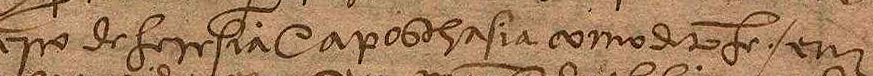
erro de heresia e aposthasia como dito he ./ em
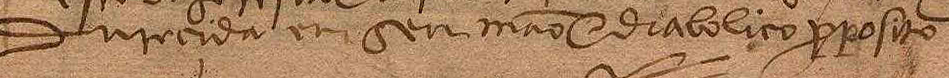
durecida em seu mao e diabolico ꝓposito
